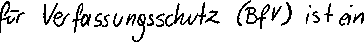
für Verfassungsschutz (BfV) ist ein
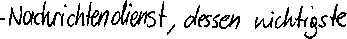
-Nachrichtendienst, dessen wichtigste
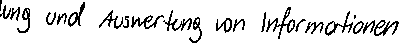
ung und Auswertung von Informationen
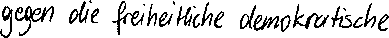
gegen die freiheitliche demokratische
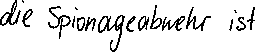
die Spionageabwehr ist
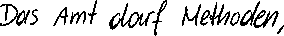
Das Amt darf Methoden,
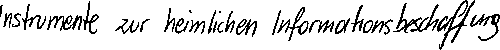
nstrumente zur heimlichen Informationsbeschaffung
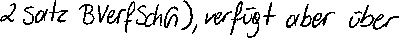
2 Satz BVerfSchG), verfügt aber über
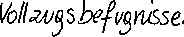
Vollzugsbefugnisse.
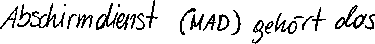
Abschirmdienst (MAD) gehört das
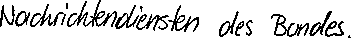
Nachrichtendiensten des Bundes.
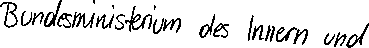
Bundesministerium des Innern und
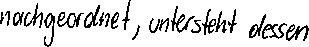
nachgeordnet, untersteht dessen
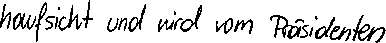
haufsicht und wird vom Präsidenten
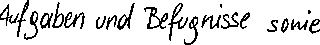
Aufgaben und Befugnisse sowie
